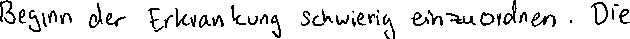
Beginn der Erkrankung schwierig einzuordnen. Die
